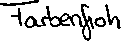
Farbenfroh
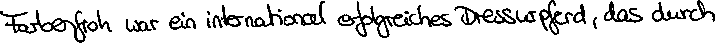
Farbenfroh war ein international erfolgreiches Dressurpferd, das durch
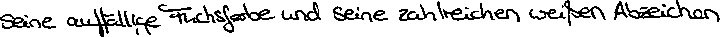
seine auffällige Fuchsfarbe und seine zahlreichen weißen Abzeichen
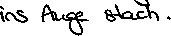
ins Auge stach.
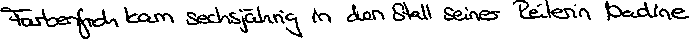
Farbenfroh kam sechsjährig in den Stall seiner Reiterin Nadine
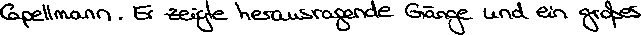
Capellmann. Er zeigte herausragende Gänge und ein großes
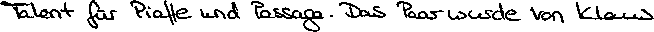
Talent für Piaffe und Passage. Das Paar wurde von Klaus
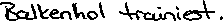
Balkenhol trainiert.
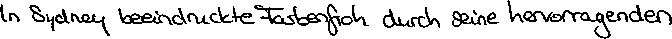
In Sydney beeindruckte Farbenfroh durch seine hervorragenden
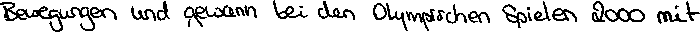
Bewegungen und gewann bei den Olympischen Spielen 2000 mit
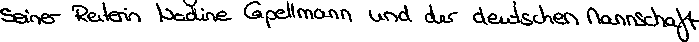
seiner Reiterin Nadine Capellmann und der deutschen Mannschaft
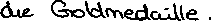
die Goldmedaille.
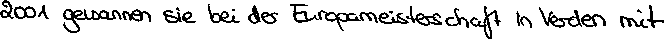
2001 gewannen sie bei der Europameisterschaft in Verden mit
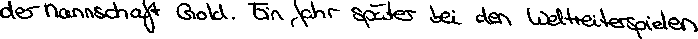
der Mannschaft Gold. Ein Jahr später bei den Weltreiterspielen
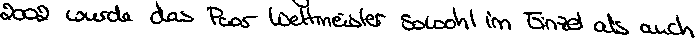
2002 wurde das Paar Weltmeister sowohl im Einzel als auch
